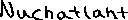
Nuchatlaht
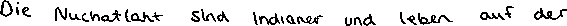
Die Nuchatlaht sind Indianer und leben auf der
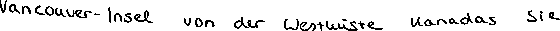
Vancouver-Insel vor der Westküste Kanadas. Sie
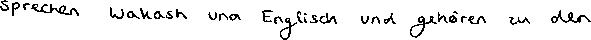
sprechen Wakash und Englisch und gehören zu den
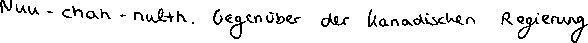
Nuu-chah-nulth. Gegenüber der kanadischen Regierung
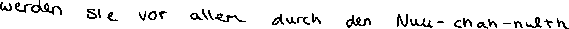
werden sie vor allem durch den Nuu-chah-nulth
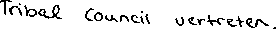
Tribal Council vertreten.
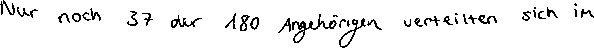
Nur noch 37 der 180 Angehörigen verteilten sich im
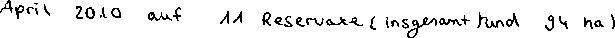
April 2010 auf 11 Reservate (insgesamt rund 94 ha)
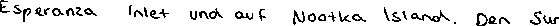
Esperanza Inlet und auf Nootka Island. Den Sun
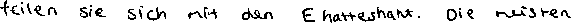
teilen sie sich mit den Ehatteshaht. Die meisten
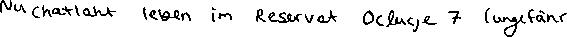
Nuchatlaht leben im Reservat Oclucje 7 (ungefähr
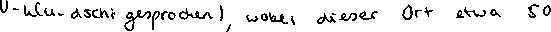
U-klu-dschi gesprochen), wobei dieser Ort etwa 50
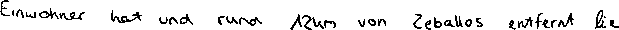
Einwohner hat und rund 12 km von Zeballos entfernt lie
